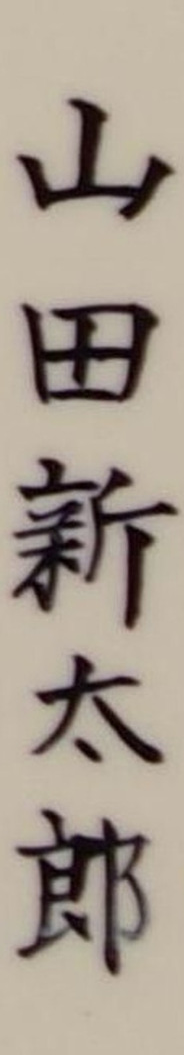山田新太郎
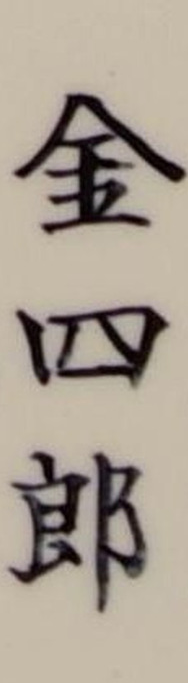金四郎
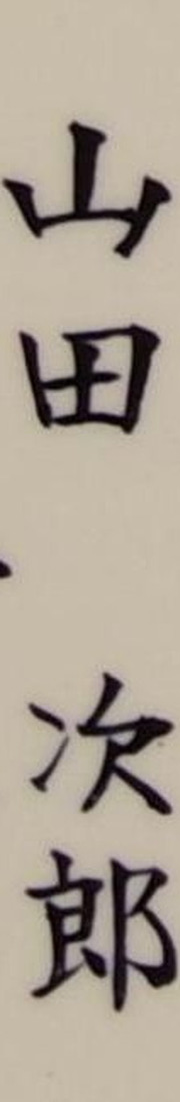山田次郎
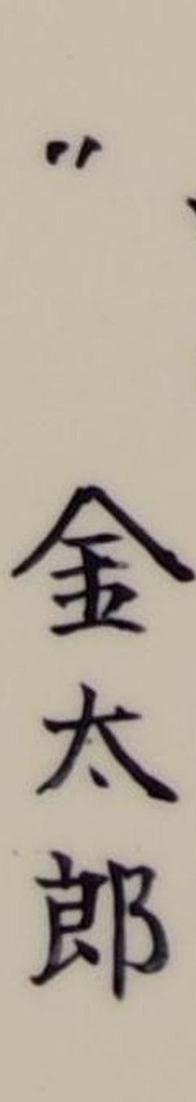金太郎
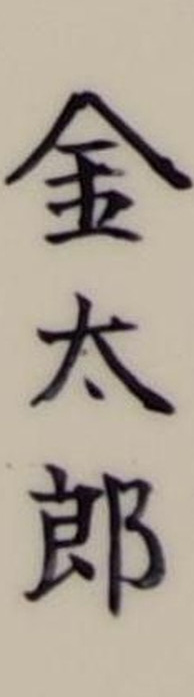金太郎

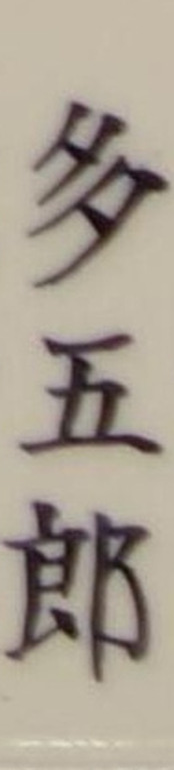多五郎
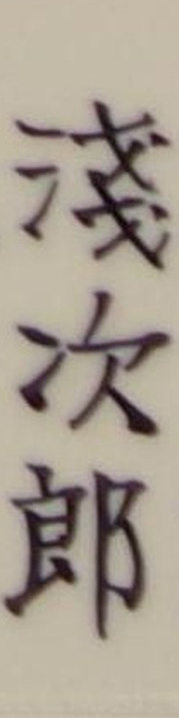浅次郎
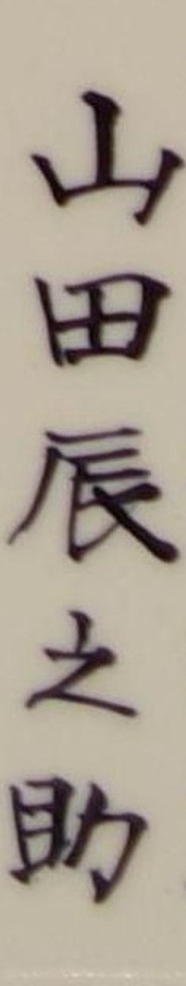山田辰之助
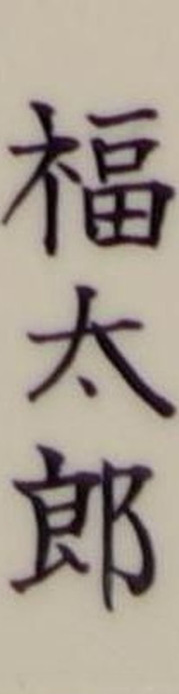福太郎
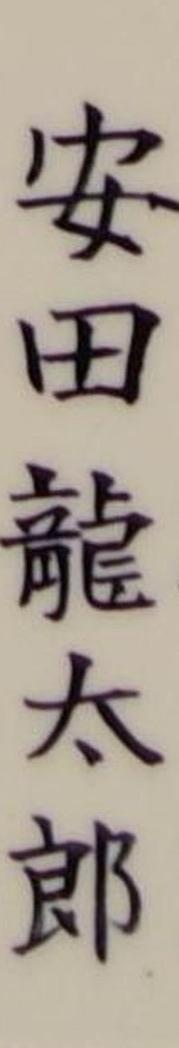安田龍太郎
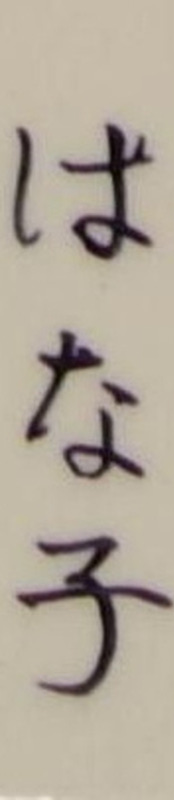はな子
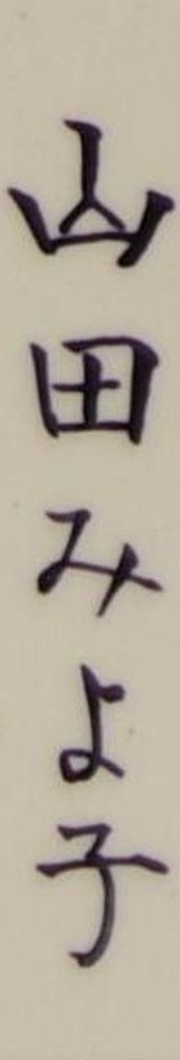山田みよ子

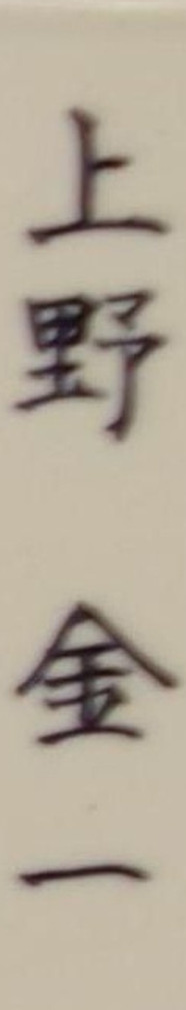上野金一
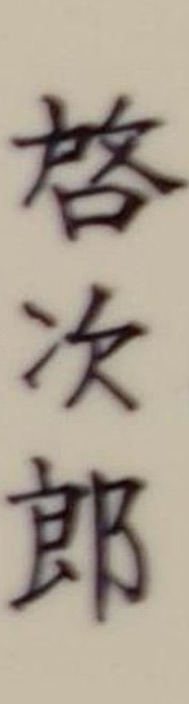啓次郎
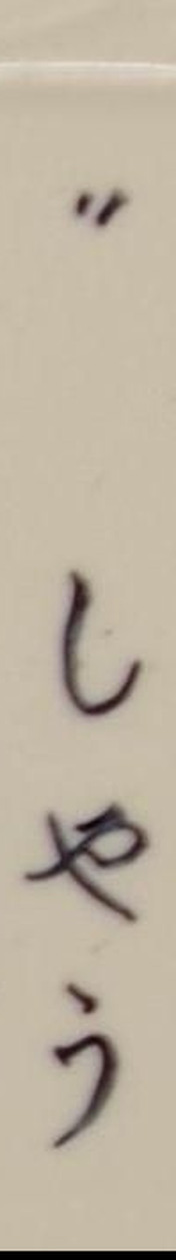しやう
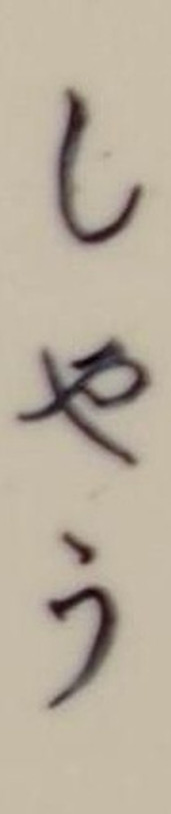しやう
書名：M~S
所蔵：高野山金剛峯寺
